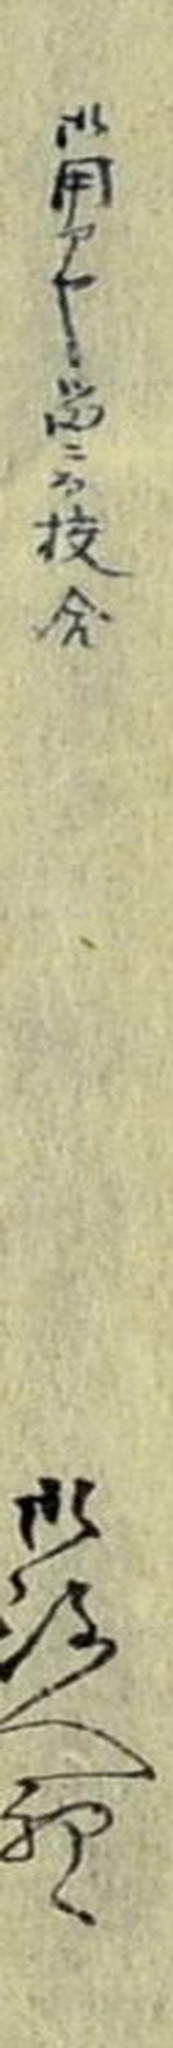御用部屋留ニ而校合御役人初へ
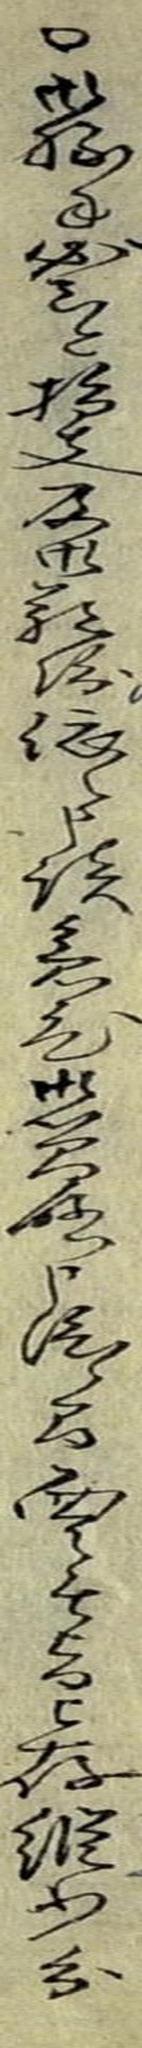〇御勝手必至と指支及御難儀依之申談急度御簡略申渡候間面々其旨被存縦少分
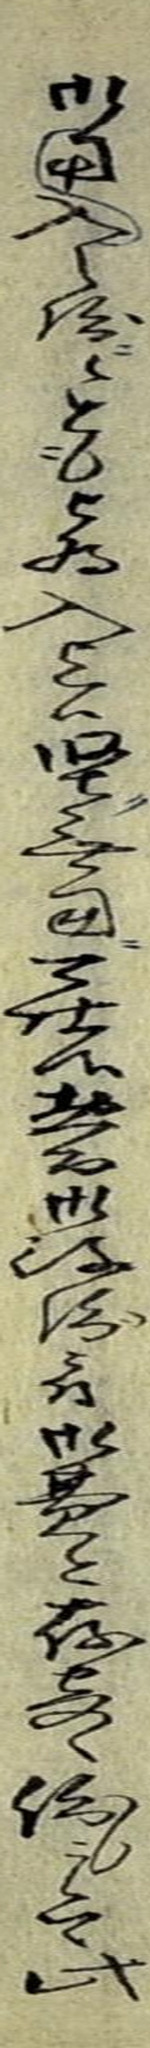御用入入用之儀候とも被為入迄ハ堅無用可仕候惣而御役儀ニ付御費と存寄候儀も候ハヽ此
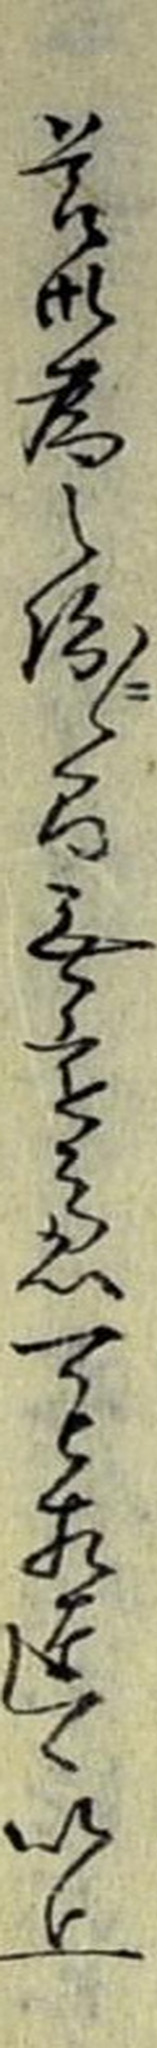節御為之儀候間無遠慮可被相達候以上二月七日
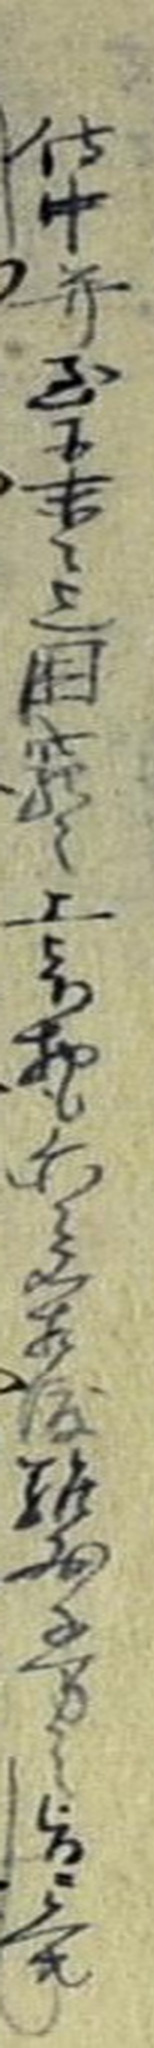侍中并末々迄困窮之上被下物も爾々不相渡難義千万之旨ニ候へ共
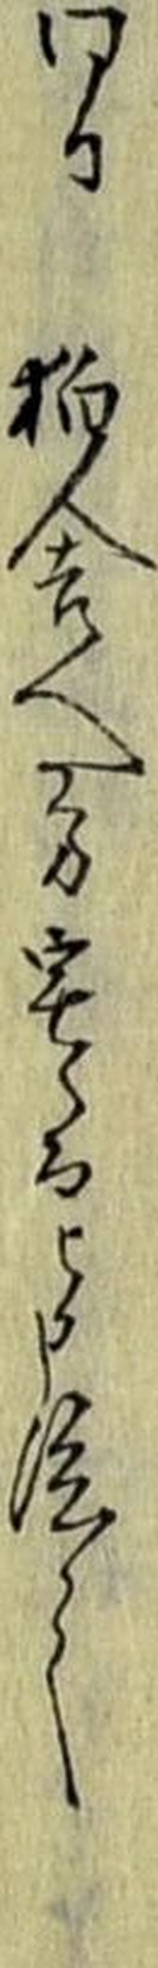同日狛舎人方宅ニ而被申渡之
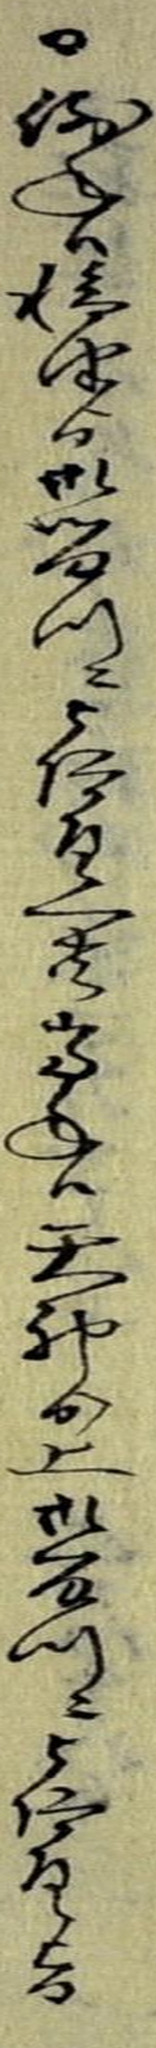〇例年ハ稲津ゟ御留川ニ被仰付候へ共当年ハ天神ゟ上御留川ニ被仰付候旨
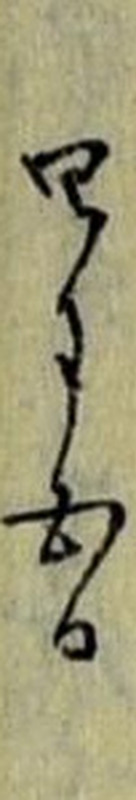四月五日
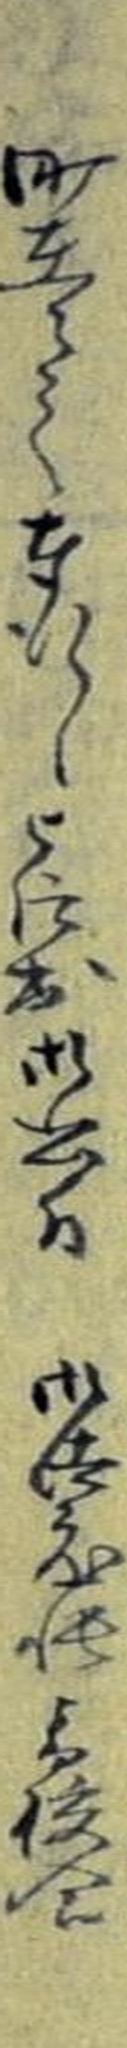町在々之奉行へ被仰出御書付御法度帳ニ而校合
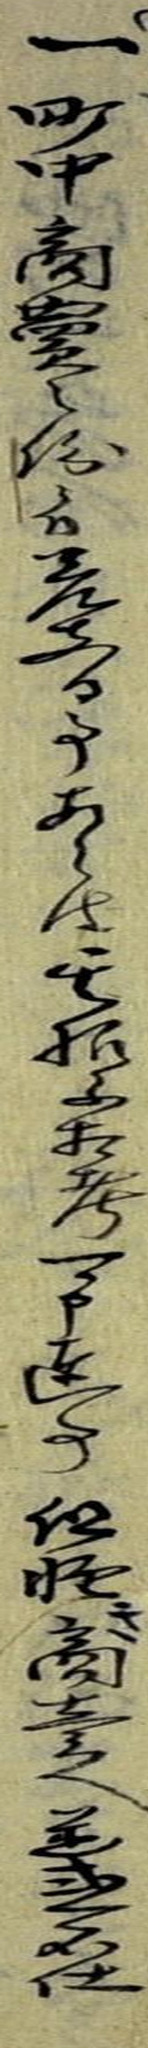一町中商売之儀ニ付差支る事あらは其様子相考可申達事但軽き商売人迷惑不仕
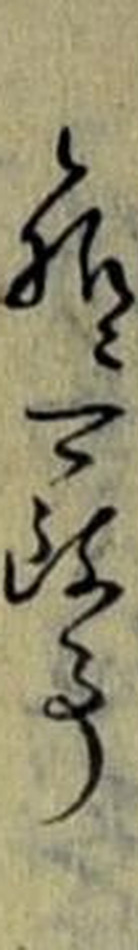候様ニ可致事
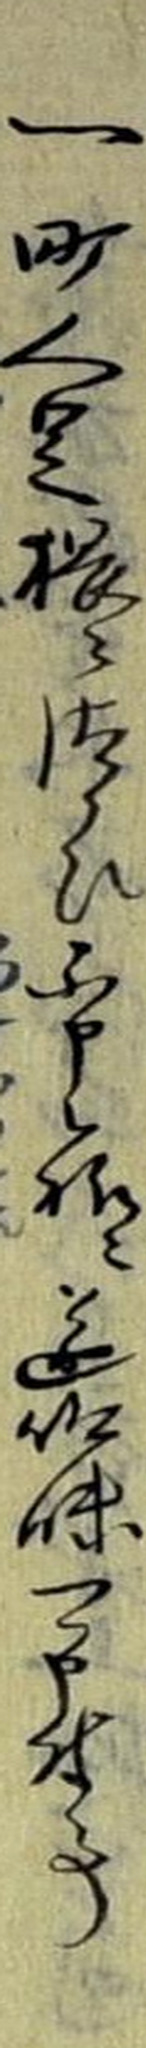一町人足猥ニつかひ不申候様ニ遂吟味可申付事
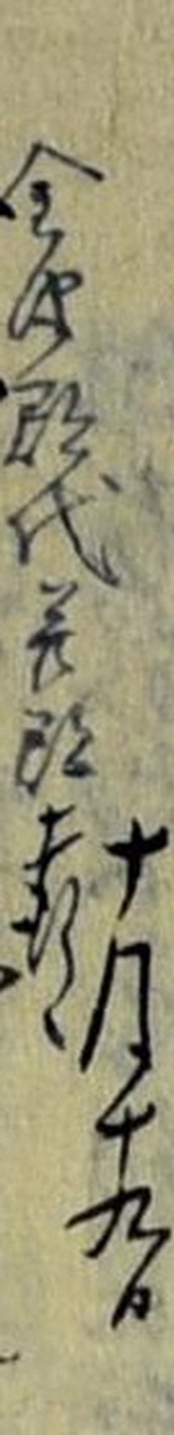金津郡代并郡奉行へ
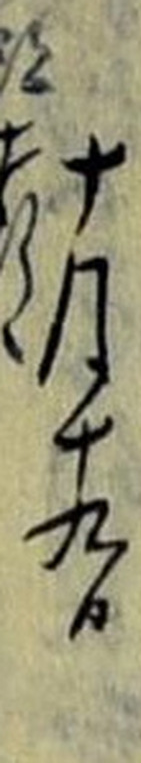十月十九日
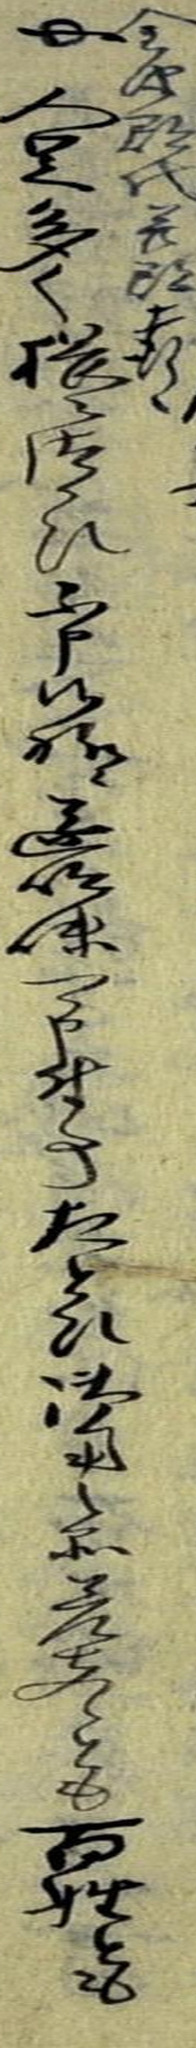一人足多く猥ニつかひ不申候様ニ遂吟味可申付事たとひ御用之品差支候とも百姓とも
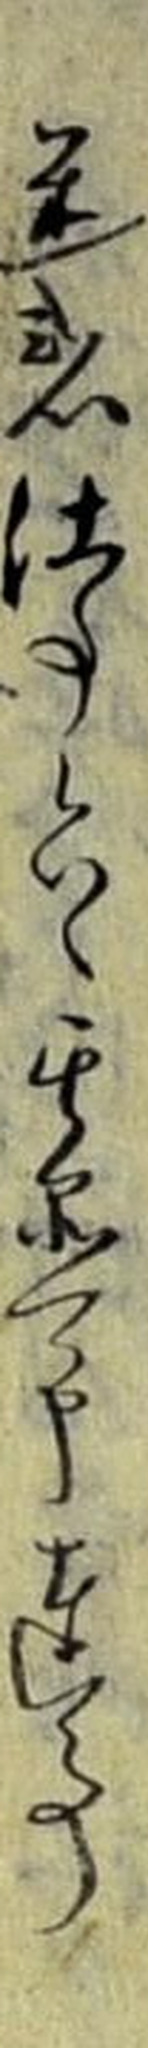迷惑仕事候ハヽ其品可申達事
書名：命令之部 一
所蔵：福井県文書館 Fukui Prefectural Archives
